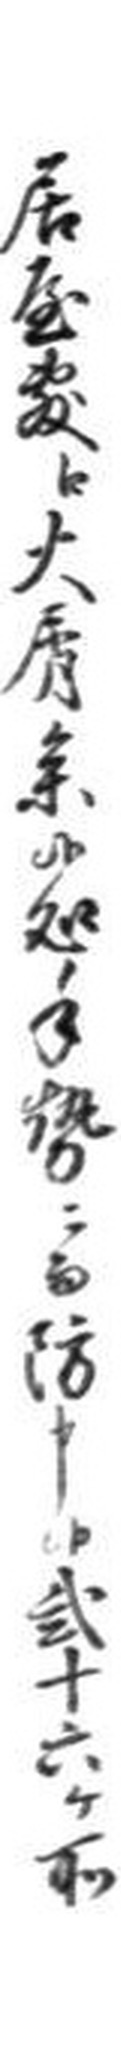居屋敷江火屑参候処手勢ニ而防申候弐十六ケ所
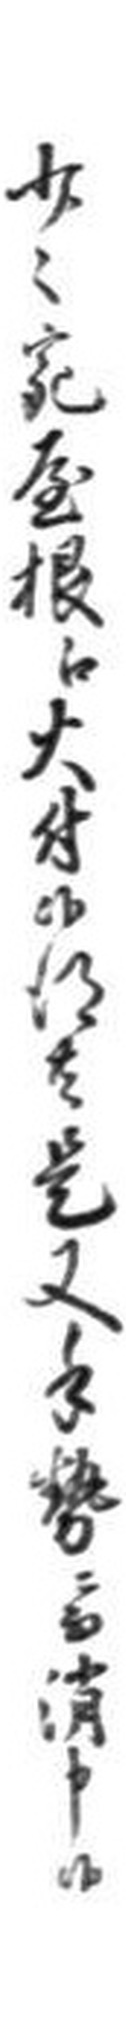少々宛屋根江火付候得共是又手勢ニ而消申候
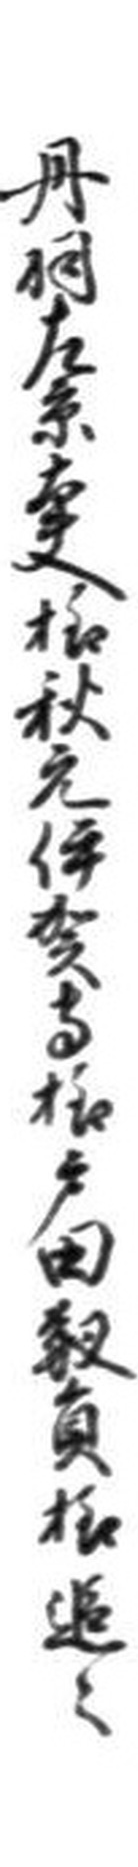丹羽左京太夫様秋元伊賀守様戸田靱負様追々
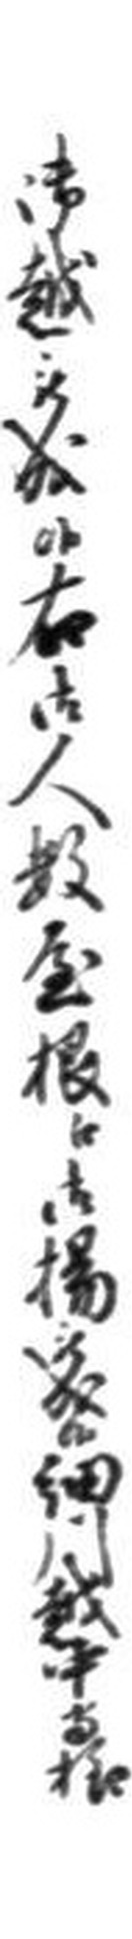御越被成候右御人数屋根江御揚被成候細川越中守様
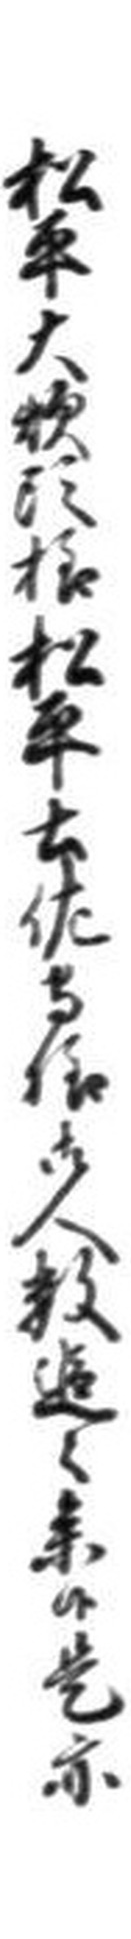松平大炊頭様松平土佐守様御人数追々参候是亦
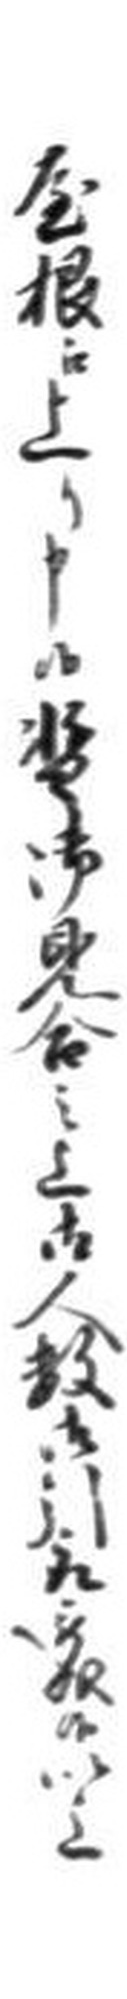屋根江上り申候暫御見合之上御人数御引取被成候以上
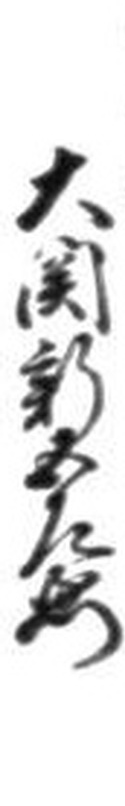大関新五左衛門
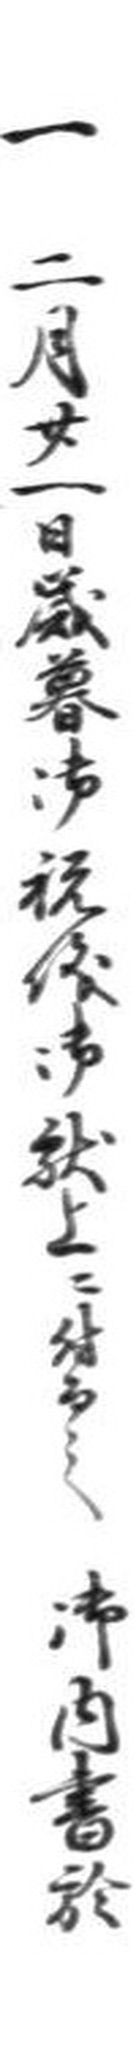一二月廿一日歳暮御祝儀御献上ニ付而之御内書於

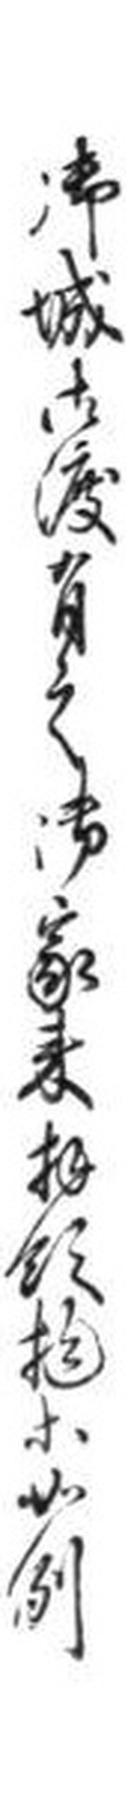御城御渡有之御家来拝領物等如例
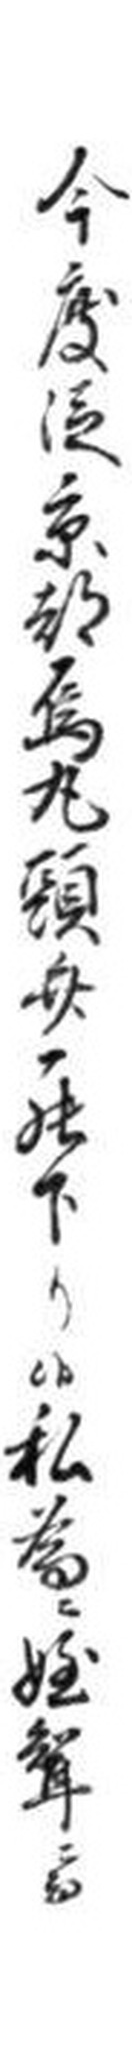今度従京都烏丸頭弁罷下り候私為ニ姪聟ニ而
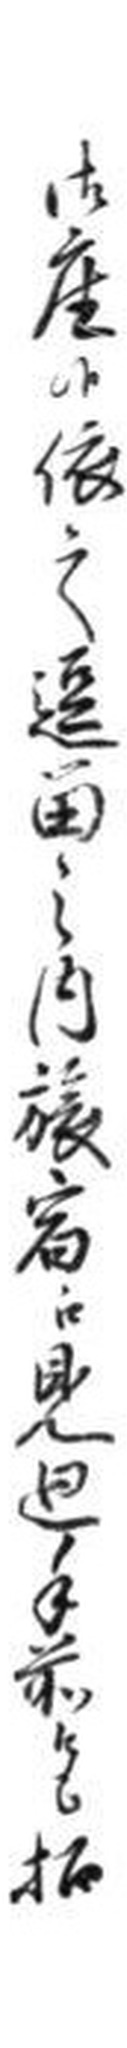御座候依之逗留之内旅宿江見廻手前江も招
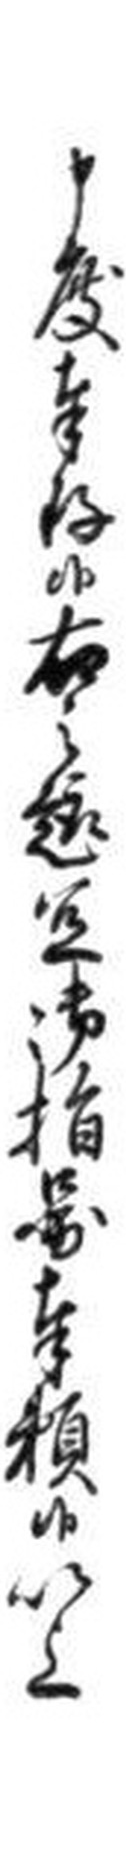申度奉存候右之趣宜御指図奉奉頼候以上
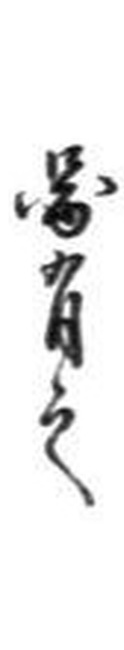図有之
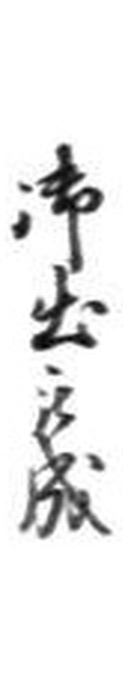御出被成
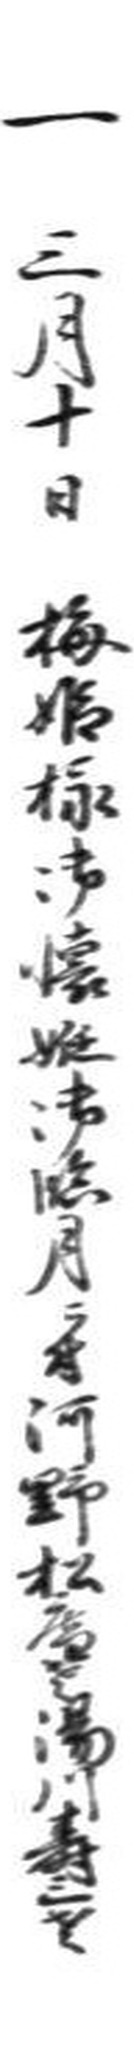一三月十日梅姫様御懐妊御臨月ニ付河野松庵老湯川寿三老
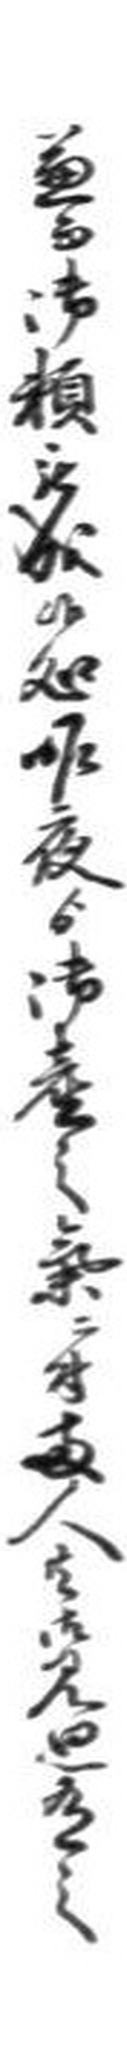兼而御頼被成候処昨夜ゟ御産之気ニ付両人共御見廻有之
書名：家譜 三十三 吉邦公 享保四年
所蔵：福井県文書館 Fukui Prefectural Archives
